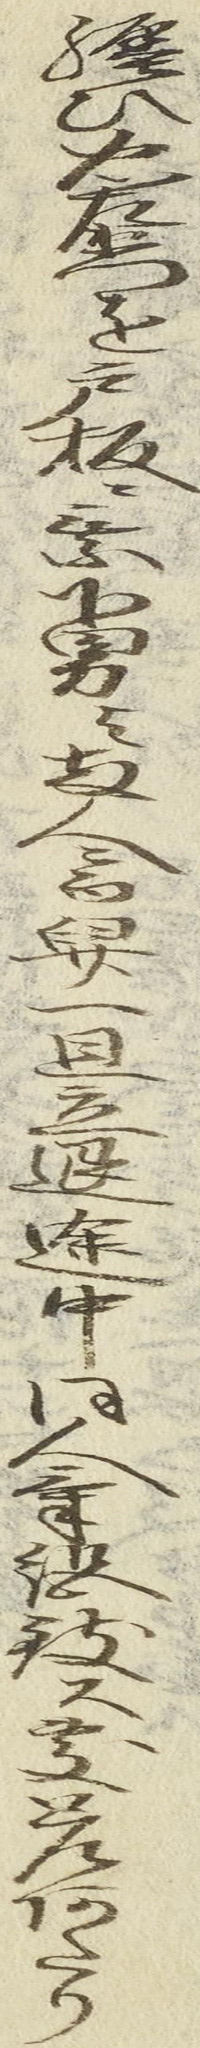纏ひ忠左衛門を戸板ニ乗下男与両人ニ而舁一旦立退途中同人気絶致ス処差あたり
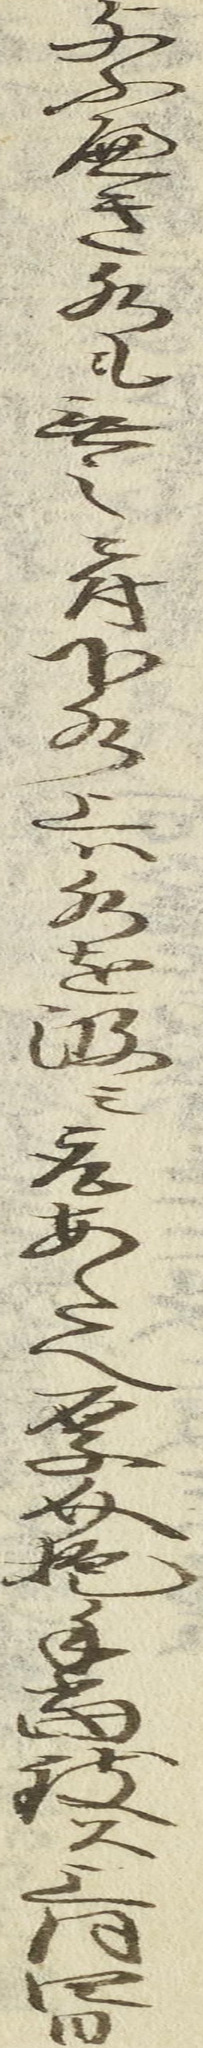与ふへき水も無之ニ付下水上は水を汲み取あたへ厚介抱手当致ス上同四日
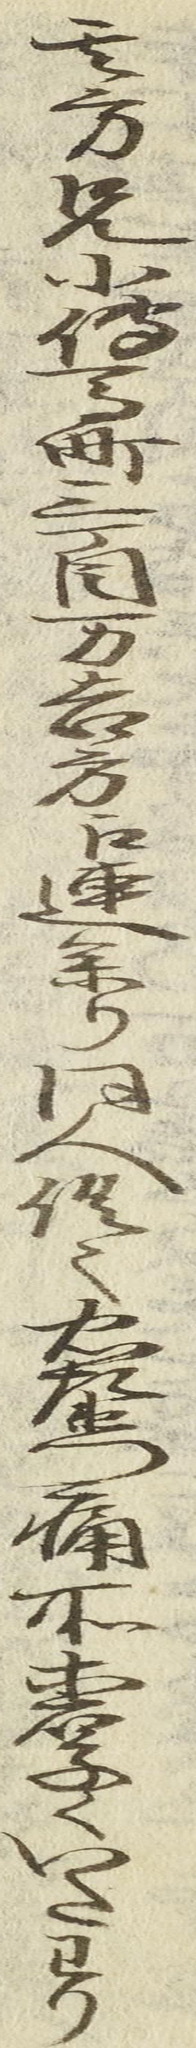其方兄小伝馬町三丁目万吉方江連参り同人倶々忠左衛門痛所等厚くいたわり
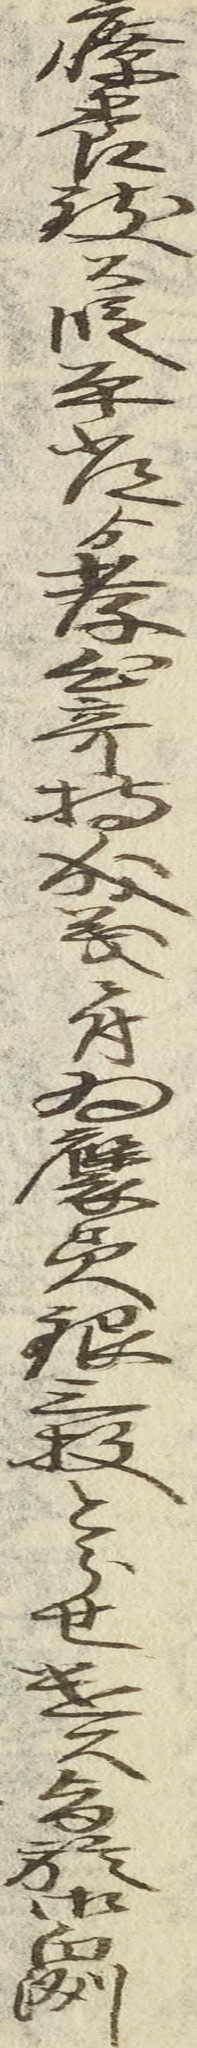療養致ス段平常ゟ孝心奇特成義ニ付為褒美銀三枚とらせ遣ス旨於御白洲
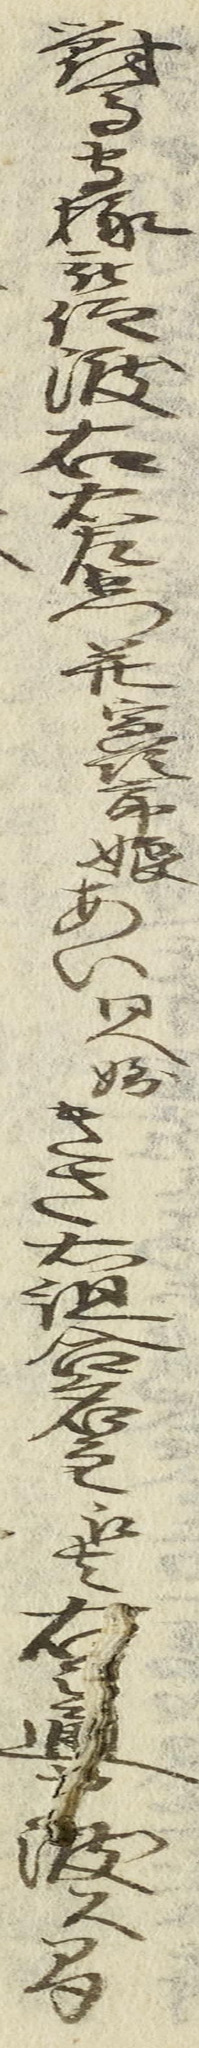対馬守様被仰渡右忠左衛門幷寅次郎娘あい同人姪きさ右組合名主江者右之通相渡ス間
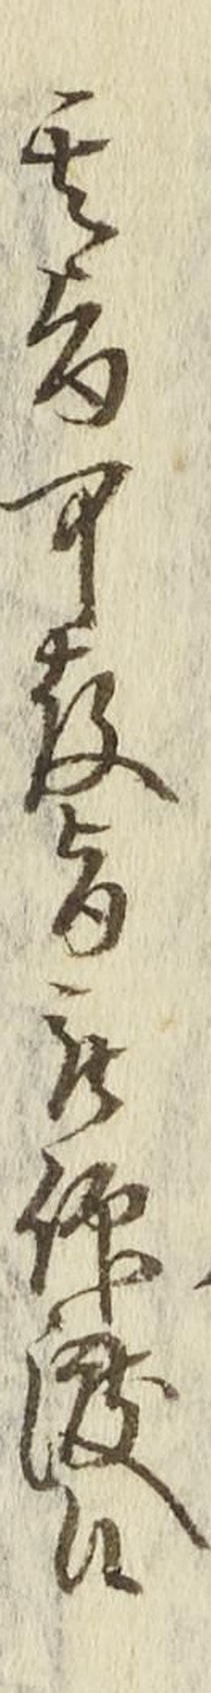其旨可存旨被仰渡候
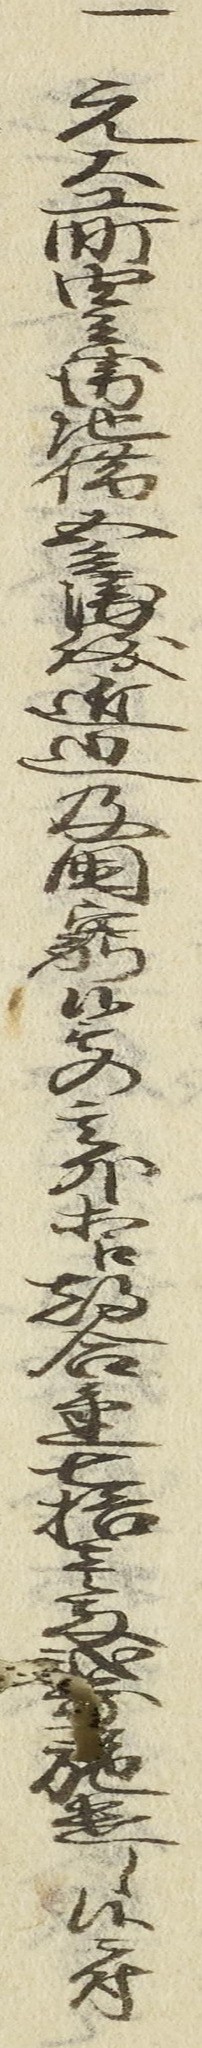一元大工町由兵衛地借五兵衛儀近辺及困窮候もの其外等江都合金七拾壱両弐歩施遣し候ニ付
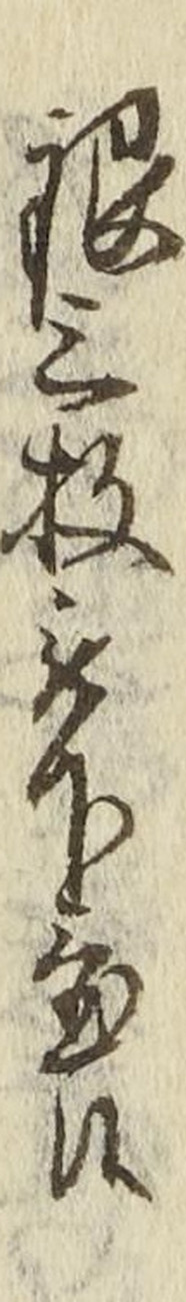銀三枚被下置候
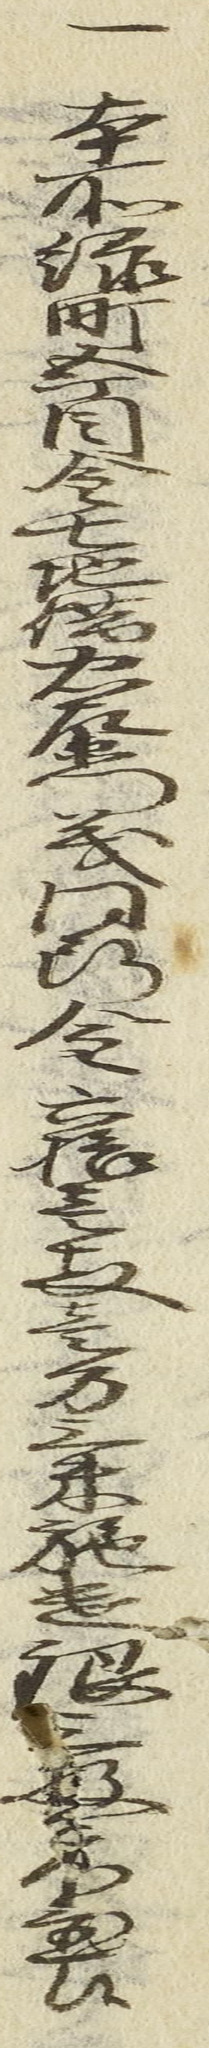一本所緑町五丁目金七地借忠左衛門義同断金六拾壱両壱分三朱施遣銀三枚被下置候
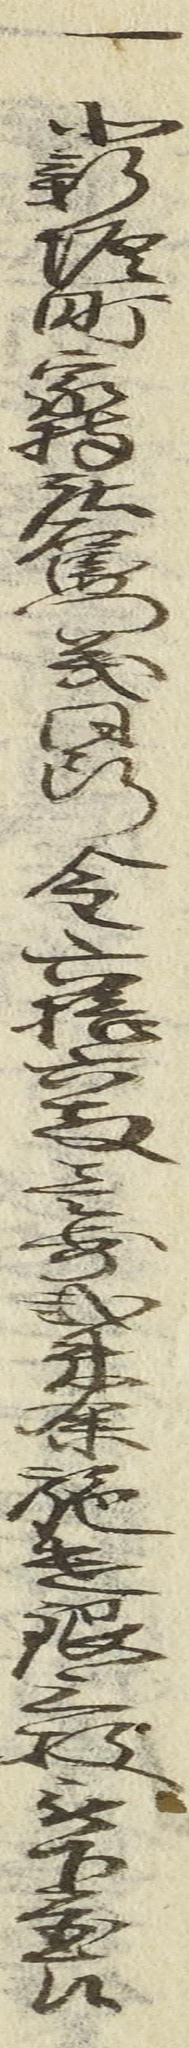一北新堀町家持庄右衛門義同断金六拾六両壱歩弐朱余施遣銀三枚被下置候
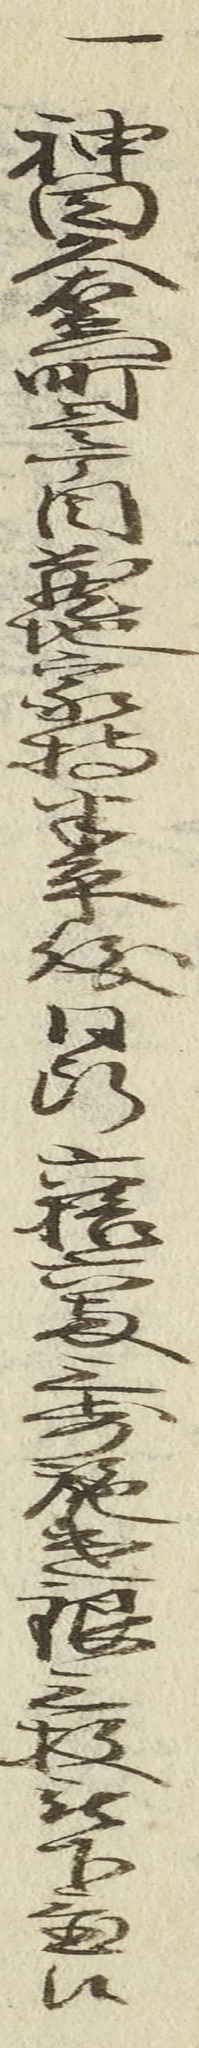一神田久右衛門町壱丁目蔵地家持半平儀同断六拾六両三歩施遣銀三枚被下置候
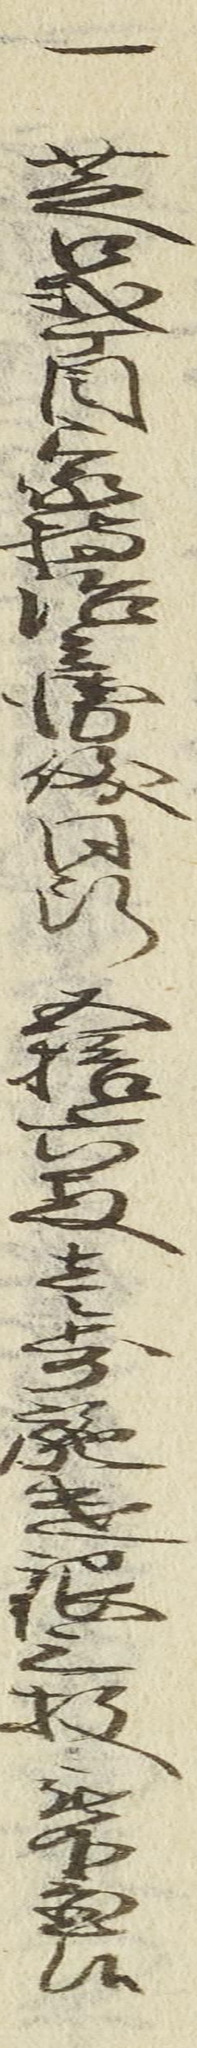一芝口弐丁目家持治兵衛儀同断五拾六両壱歩施遣銀三枚被下置候
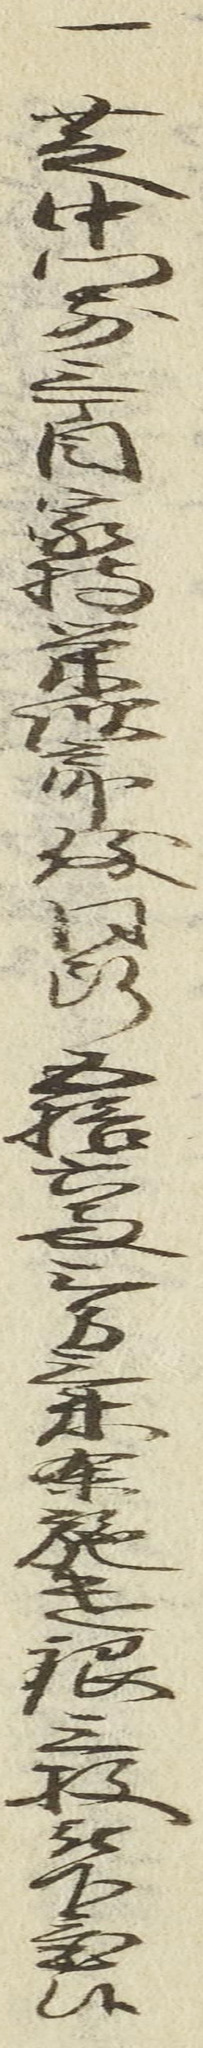一芝中門前三丁目家持栄次郎儀同断五拾六両三分三朱施遣銀三枚被下置候
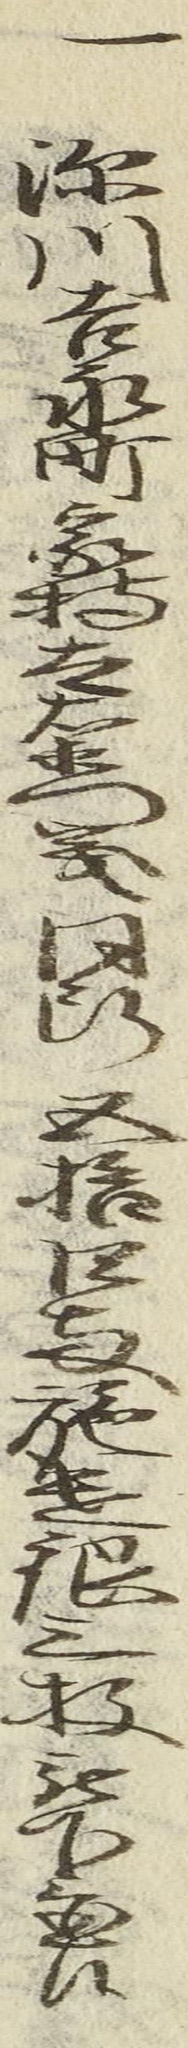一深川吉永町家持太右衛門義同断五拾四両施遣銀三枚被下置候
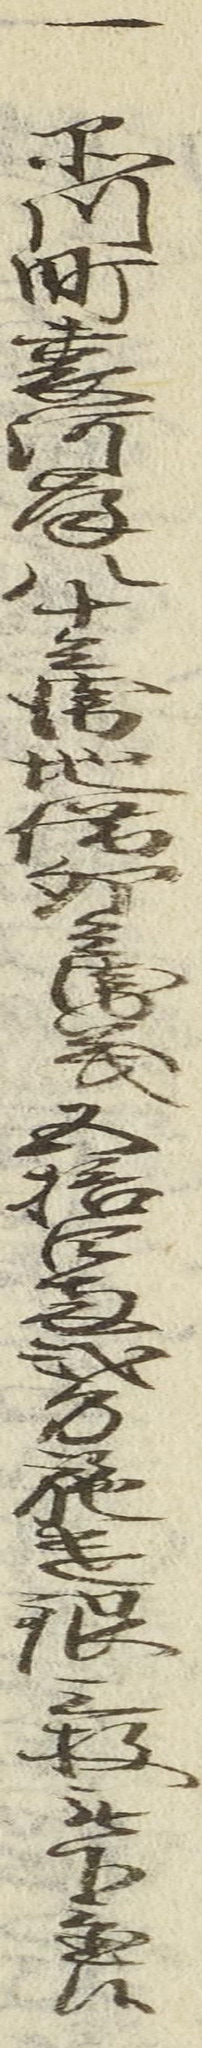一品川町裏河岸八十兵衛地借卯兵衛義五拾四両弐分施遣銀三枚被下置候
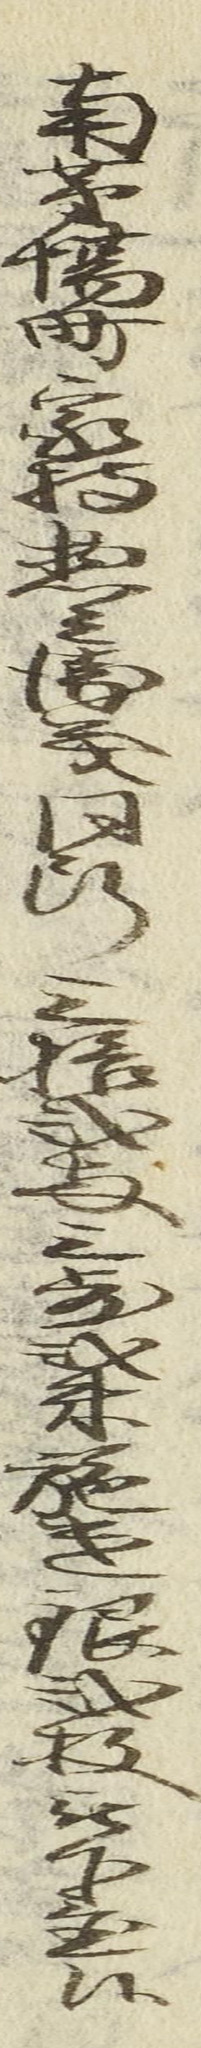一南茅場町家持惣兵衛義同断三拾弐両三歩弐朱施遣銀弐枚被下置候
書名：安政二年震災記事　完
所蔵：東京大学地震研究所図書室 Earthquake Research Institute Library, The University of Tokyo, JAPAN
